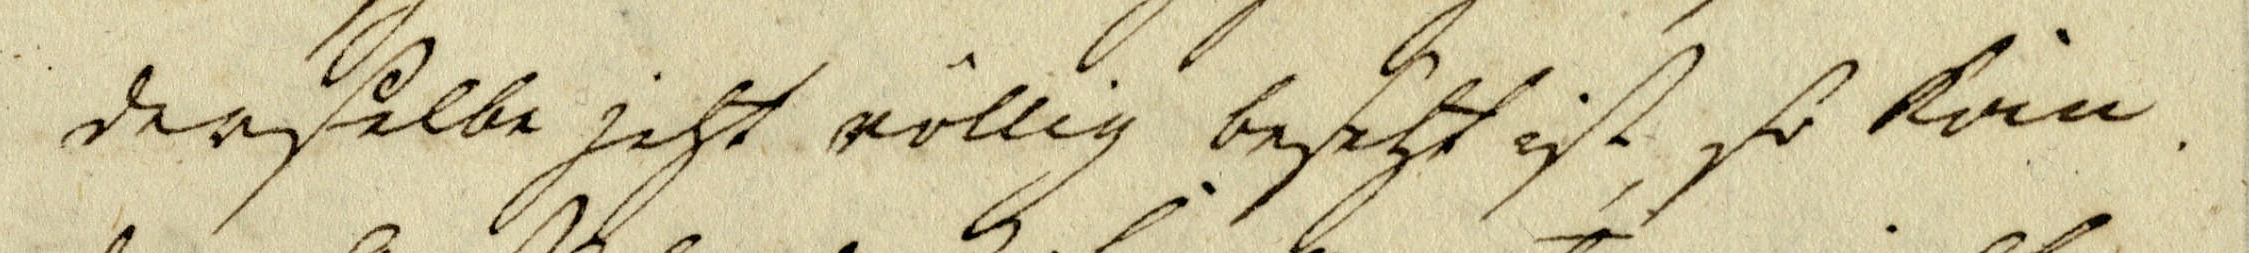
derselbe jetzt völlig besetzt ist, so kan
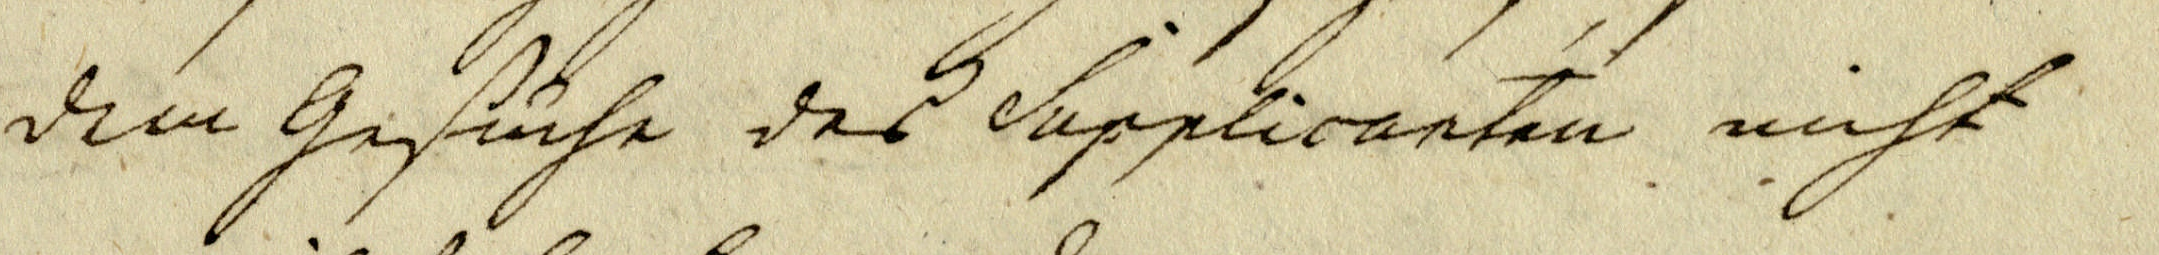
dem Gesuche des Supplicanten nicht
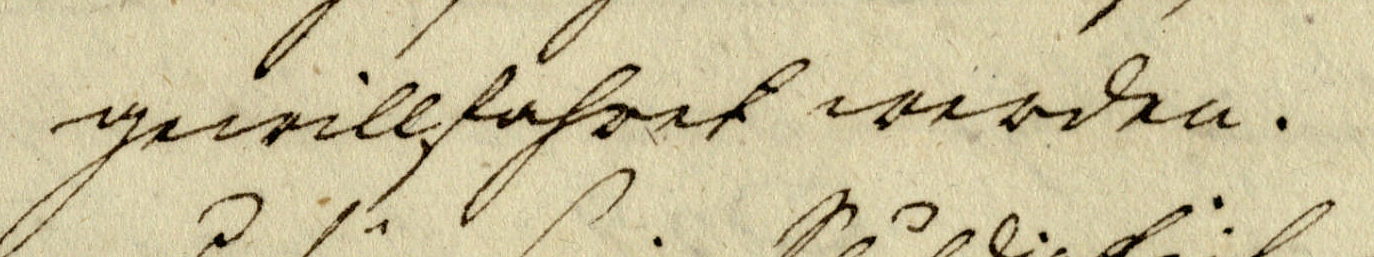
gewillfahret werden.
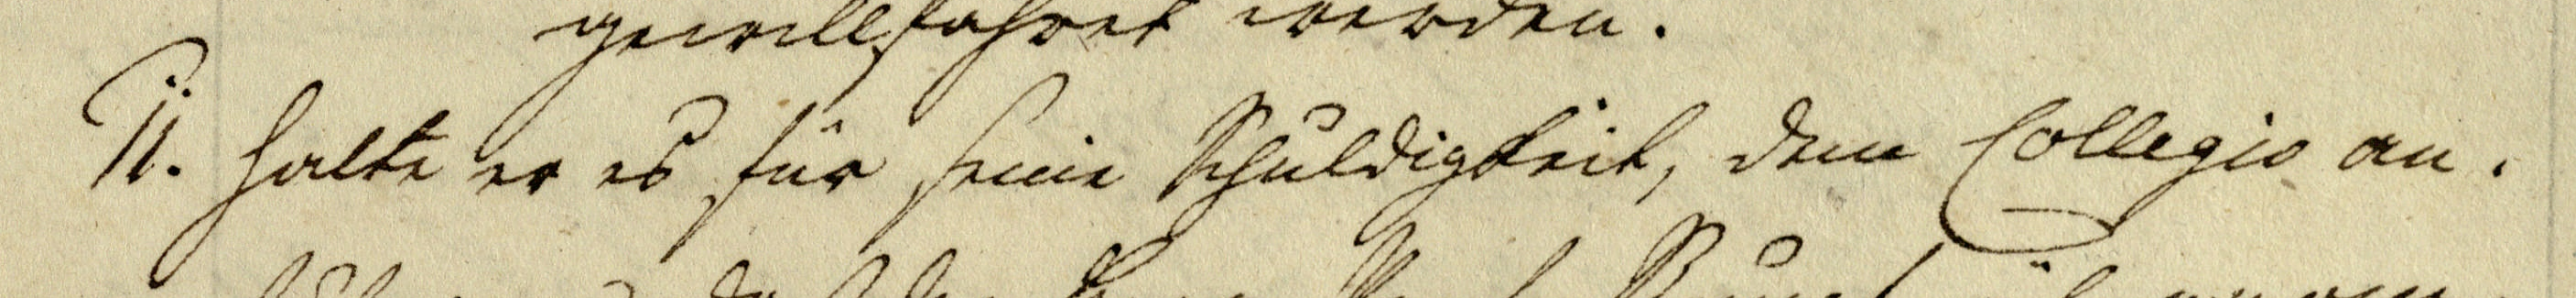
11. halte er es für seine Schuldigkeit, dem Collegio an¬
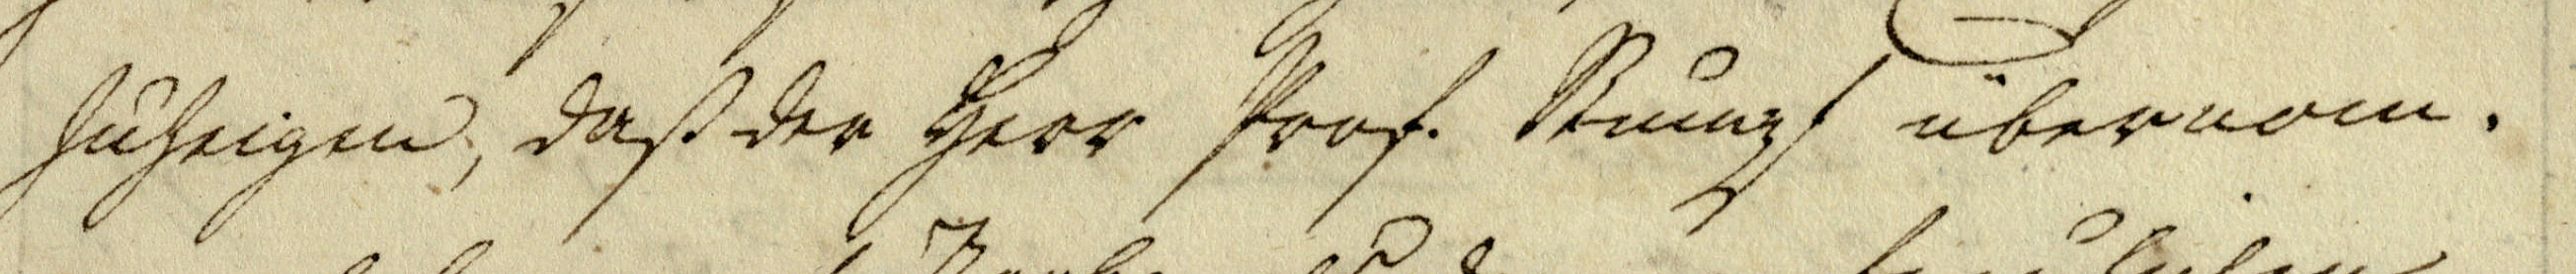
zuzeigen, daß der Herr Prof. Stumpf übernom¬
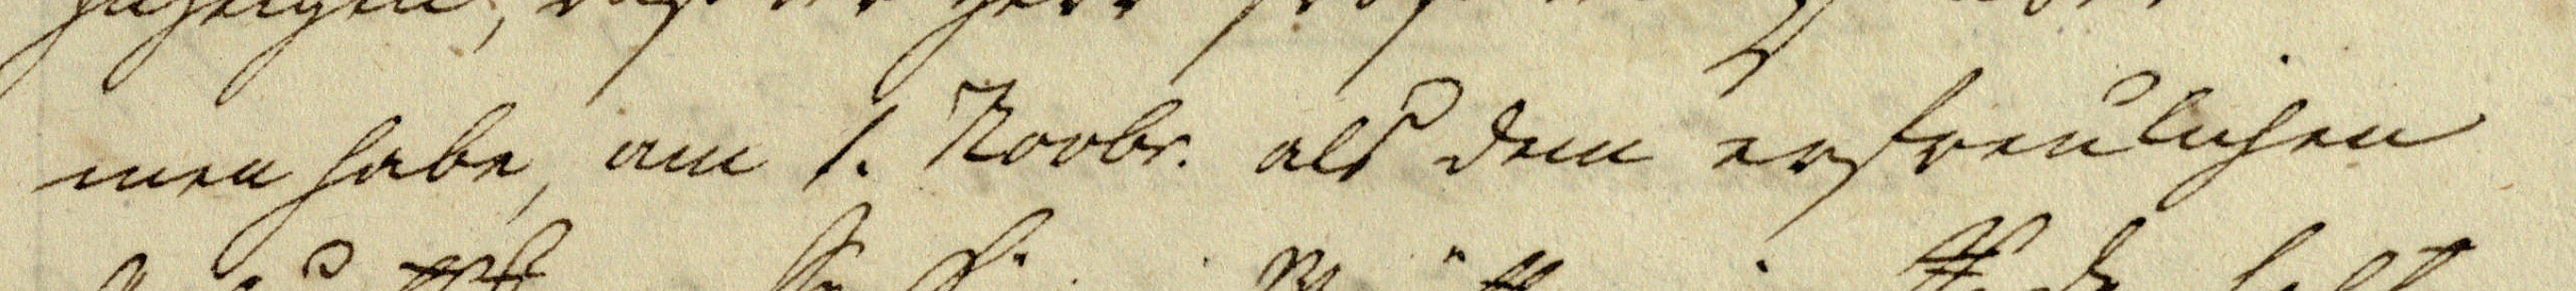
men habe, am 1. Novbr. als dem erfreulichen
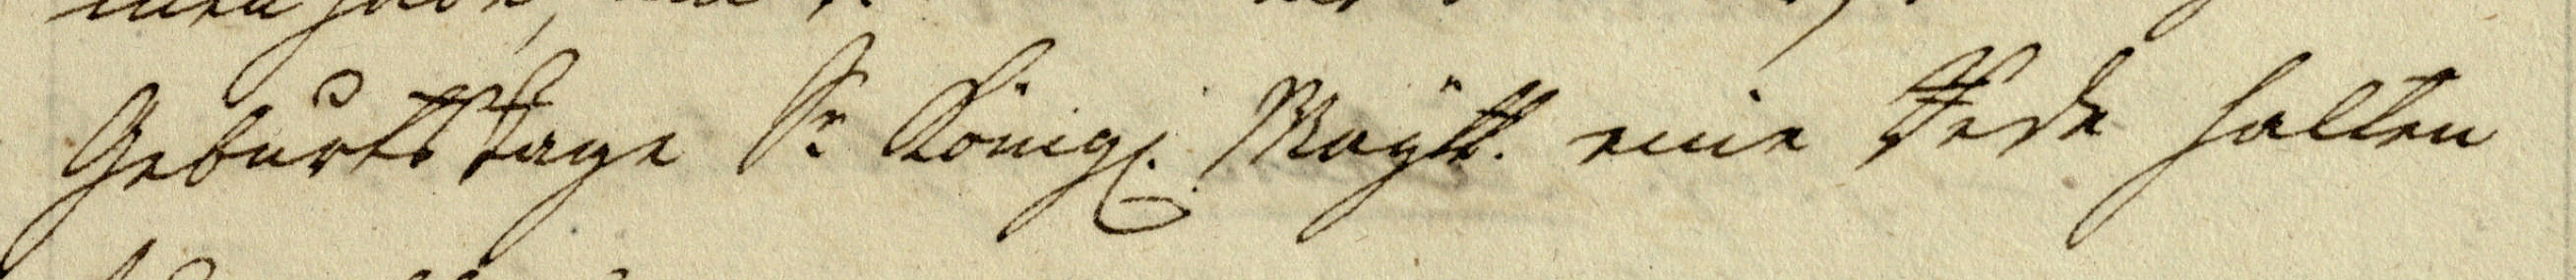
GeburtsTage Sr Königl Maÿtt. eine Rede halten
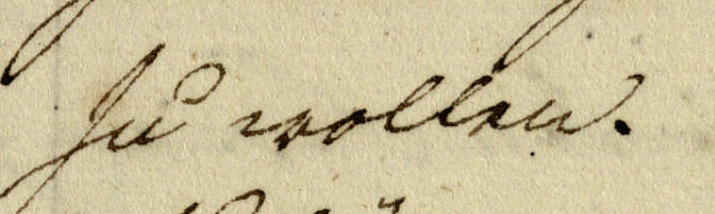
zu wollen.
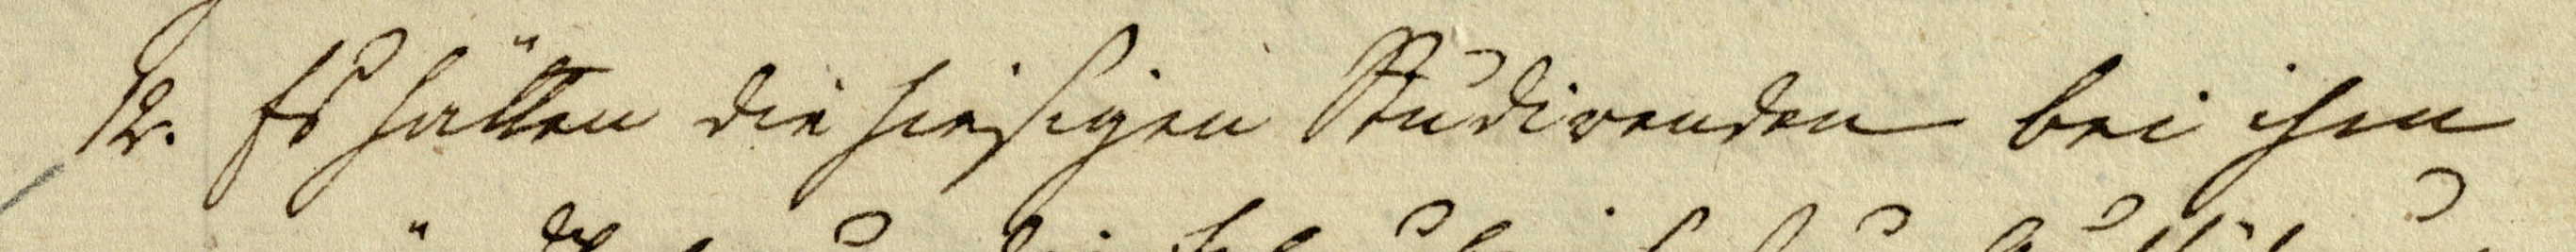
12. Es hätten die hiesigen Studirenden bei ihm
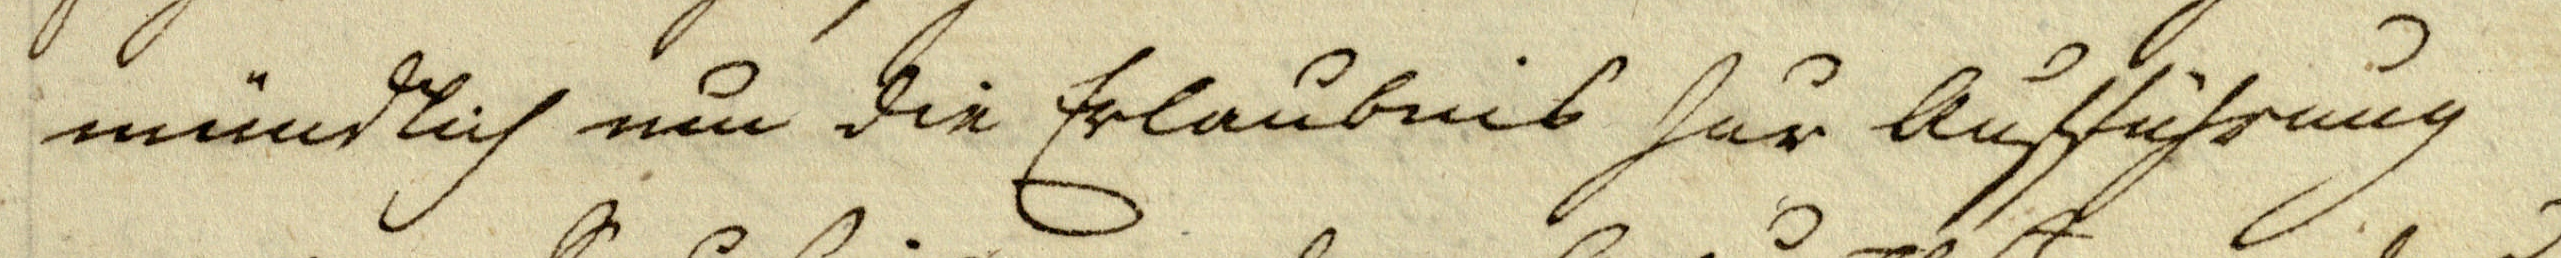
mündlich um die Erlaubnis zur Aufführung
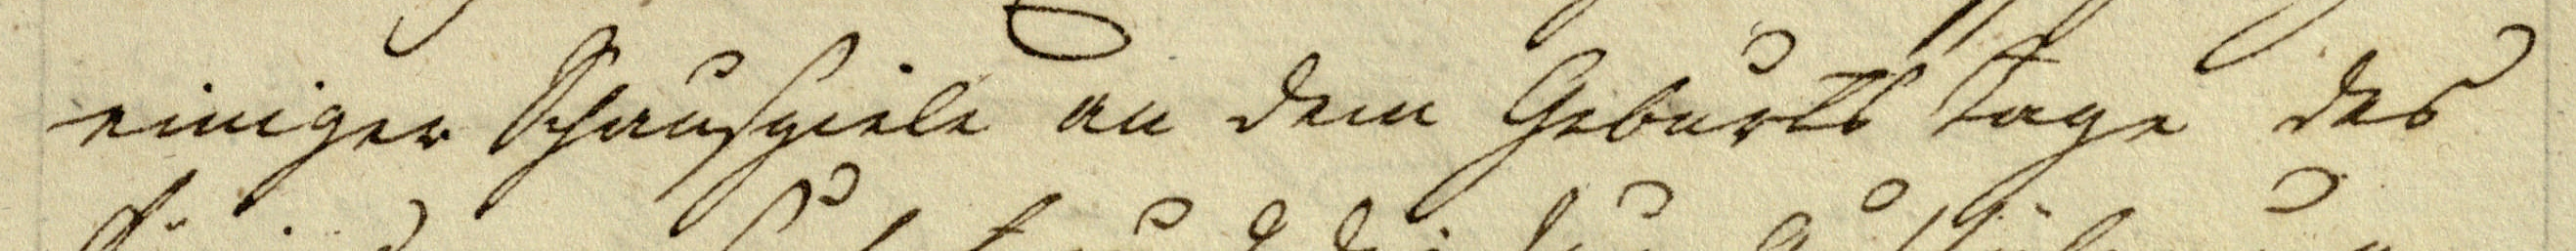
einiger Schauspiele an dem Geburts Tage des
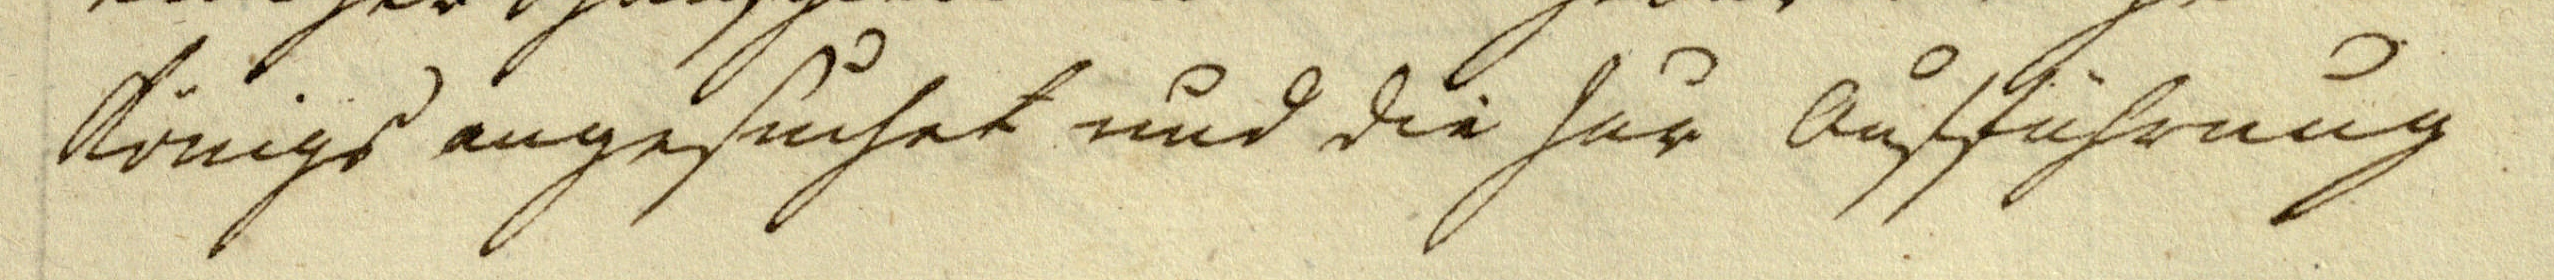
Königs angesuchet und die zur Aufführung
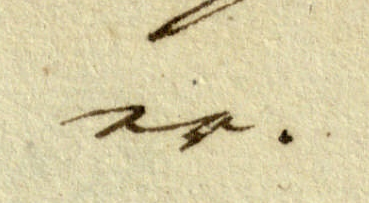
er¬
